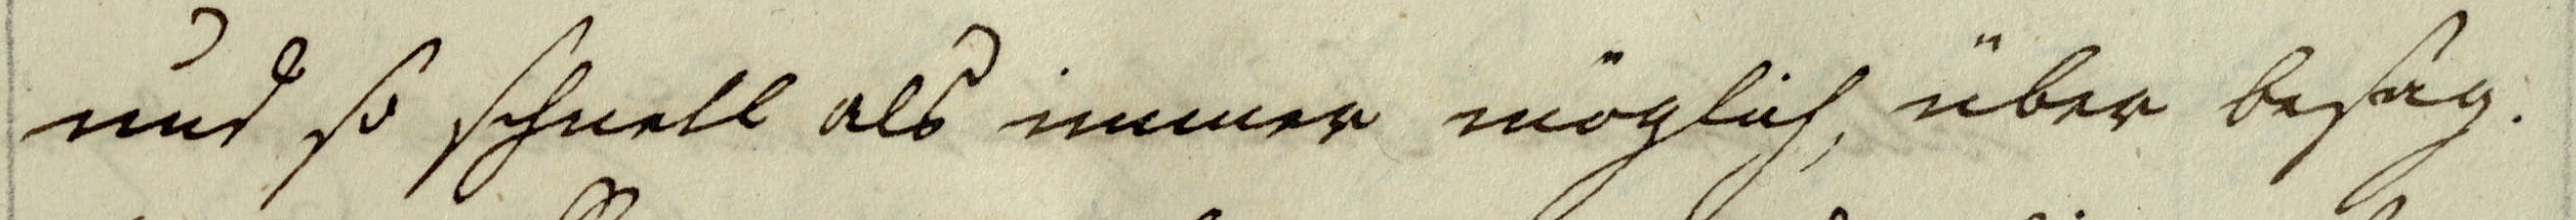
und so schnell als immer möglich, über besag¬
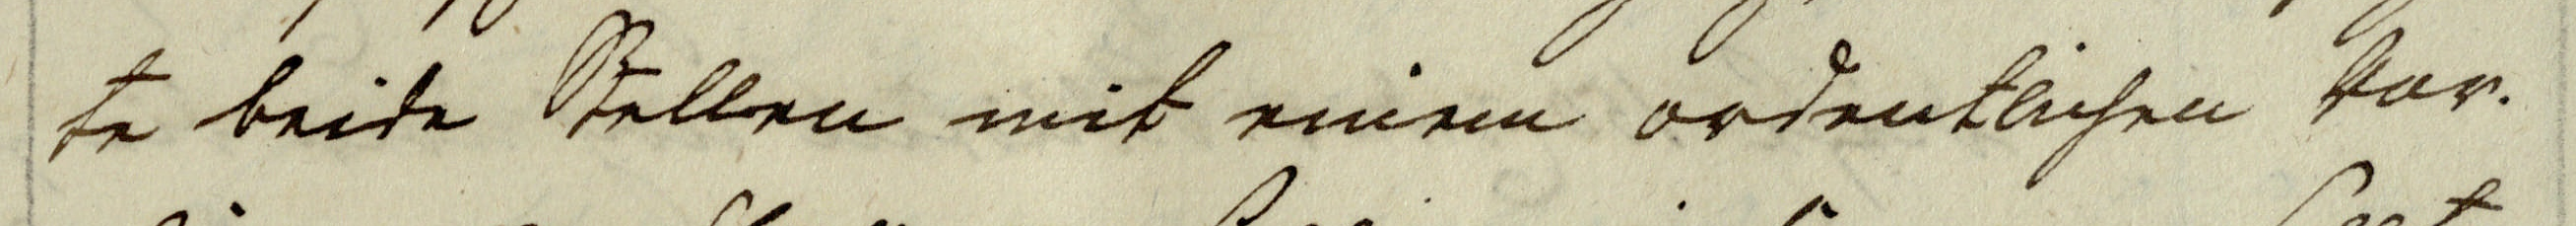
te beide Stellen mit einem ordentlichen Vor¬
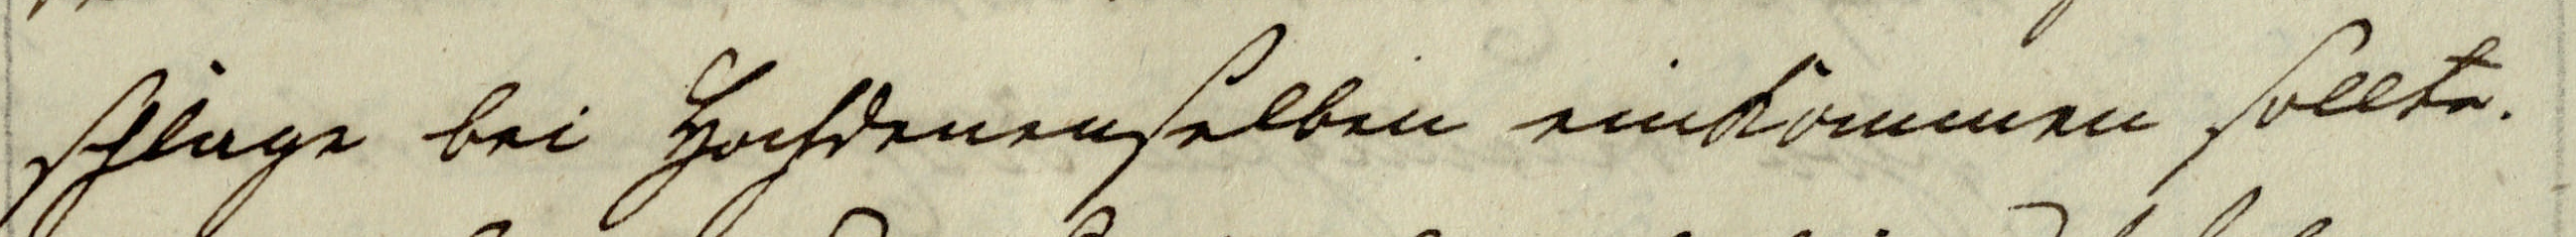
schlage bei Hochdenenselben einkommen sollte.
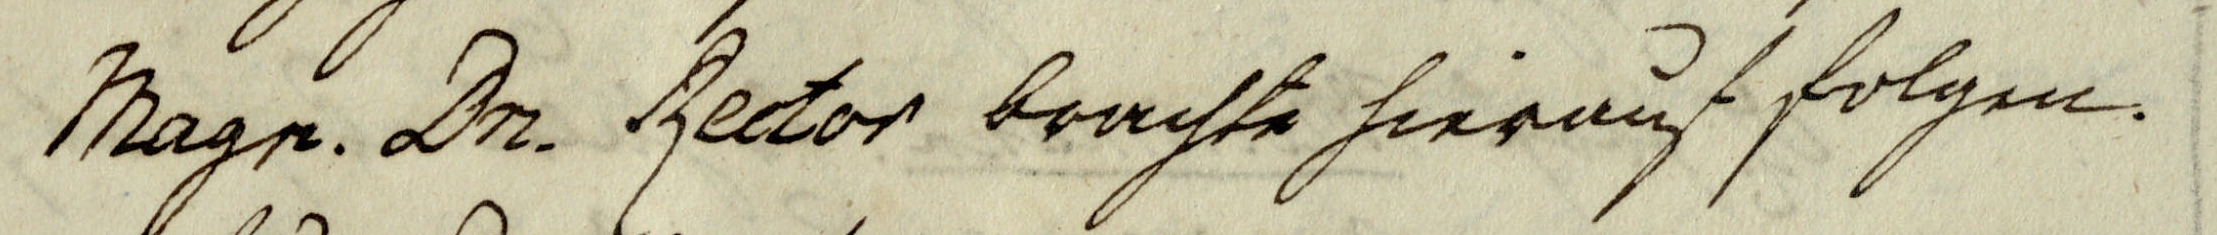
Magn. Dn. Rector brachte hierauf folgen¬
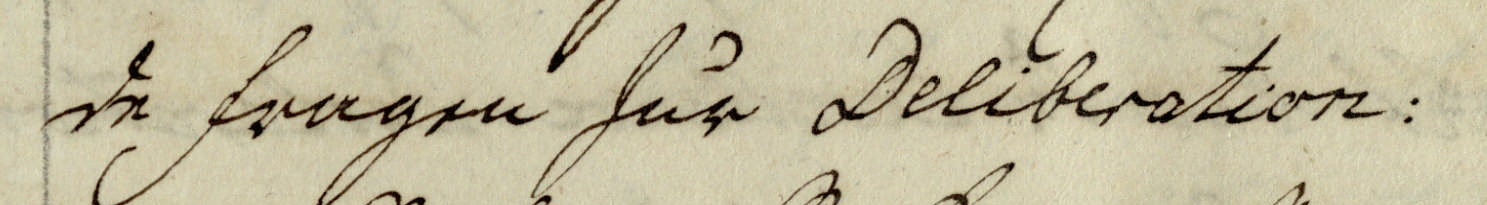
de Fragen zur Deliberation:
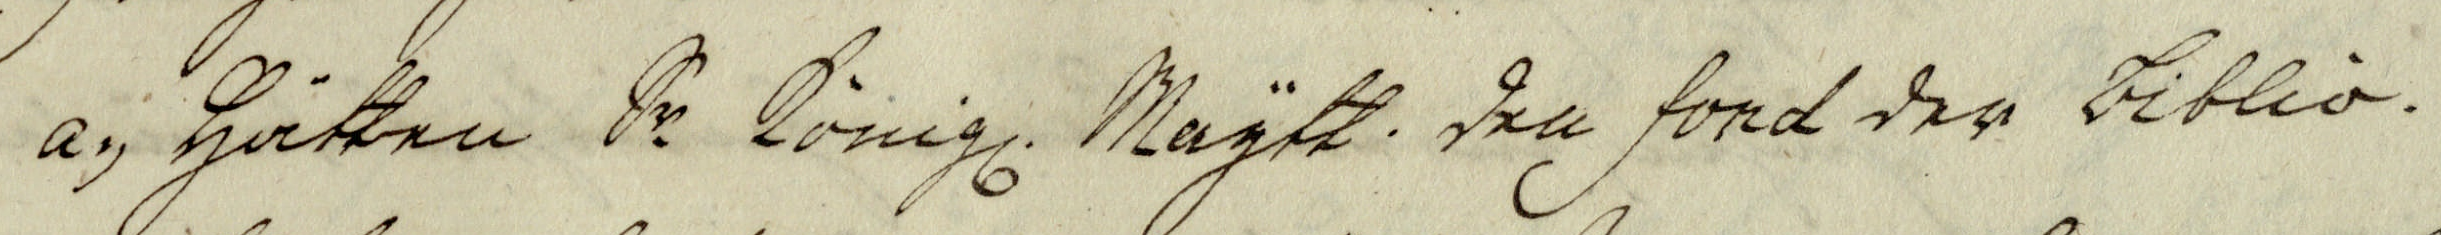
a., Hätten Sr. Königl. Maÿst. den Fond der Biblio¬
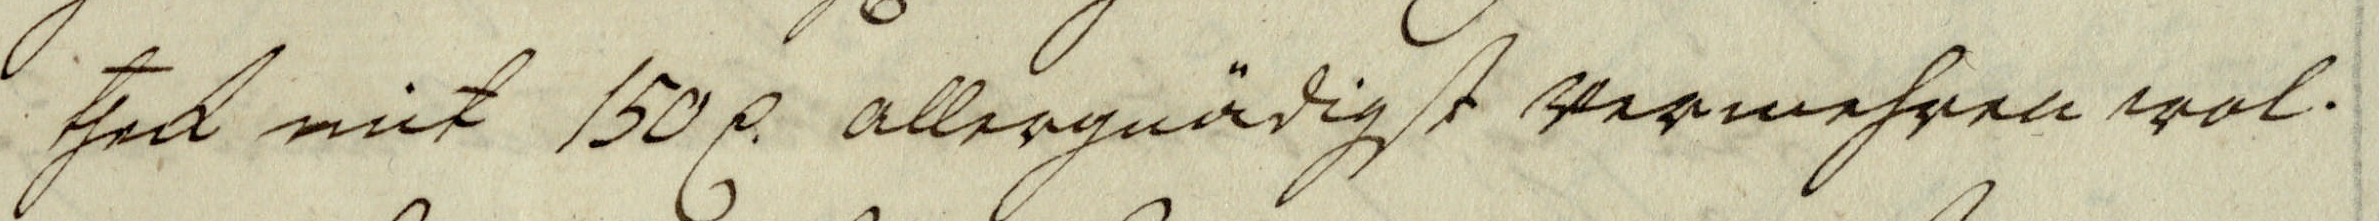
thek mit 150 rtl. allergnädigst vermehren wol¬
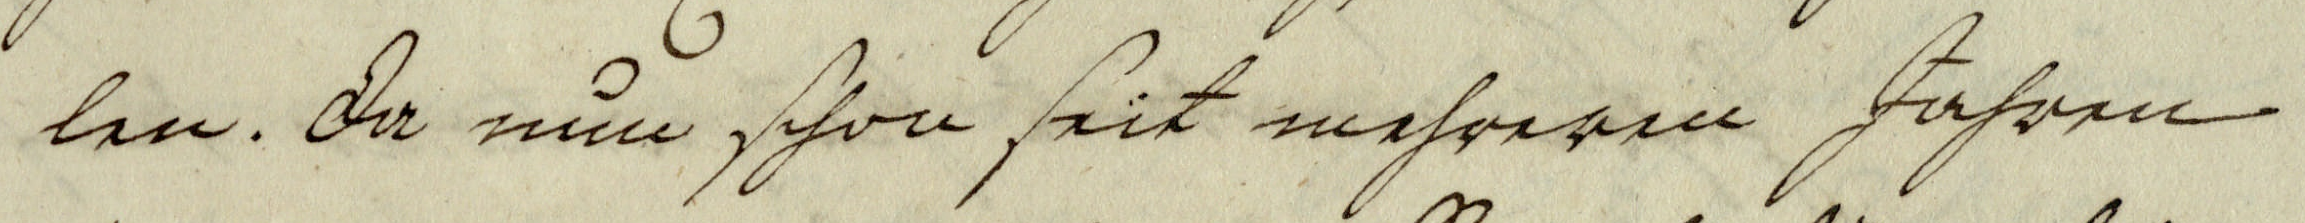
len. Da nun schon seit mehreren Jahren
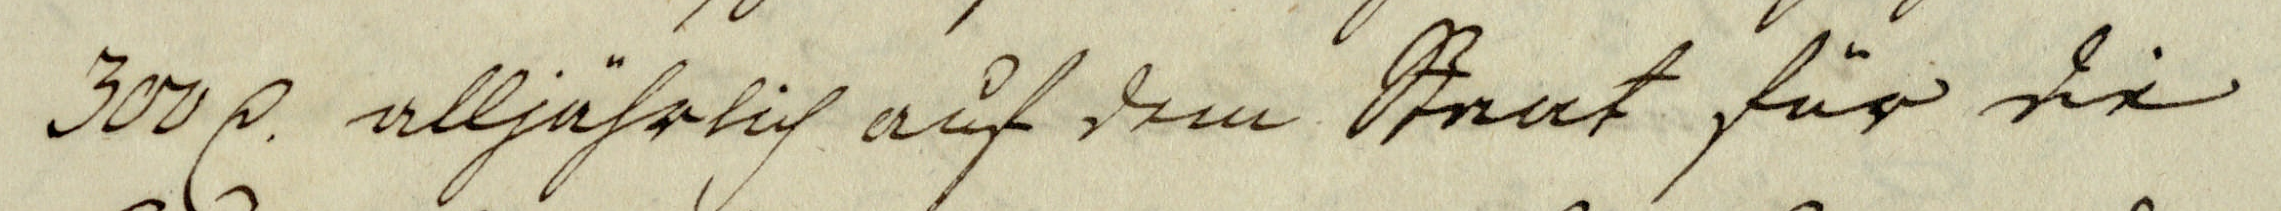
300 rtl. alljährlich auf dem Staat für die
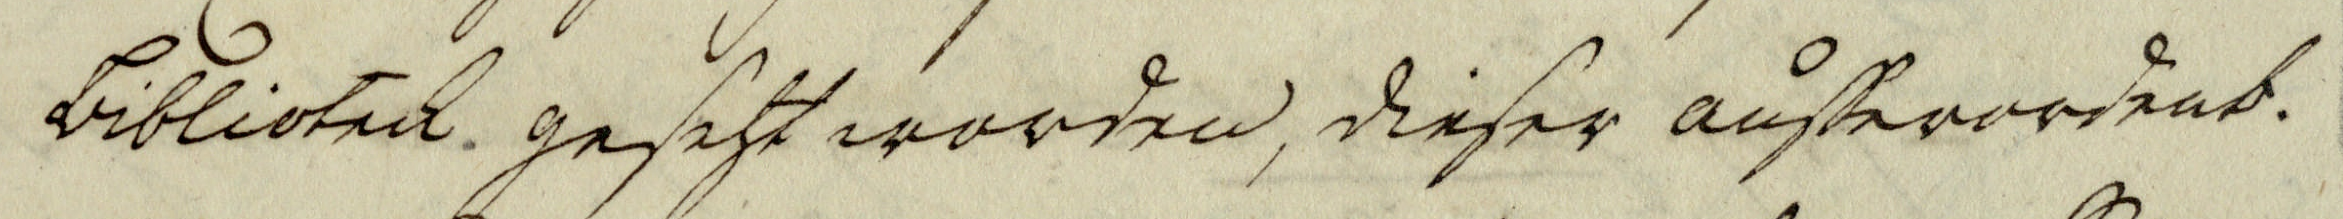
Bibliotek gesetzt worden, dieser ausserordent¬
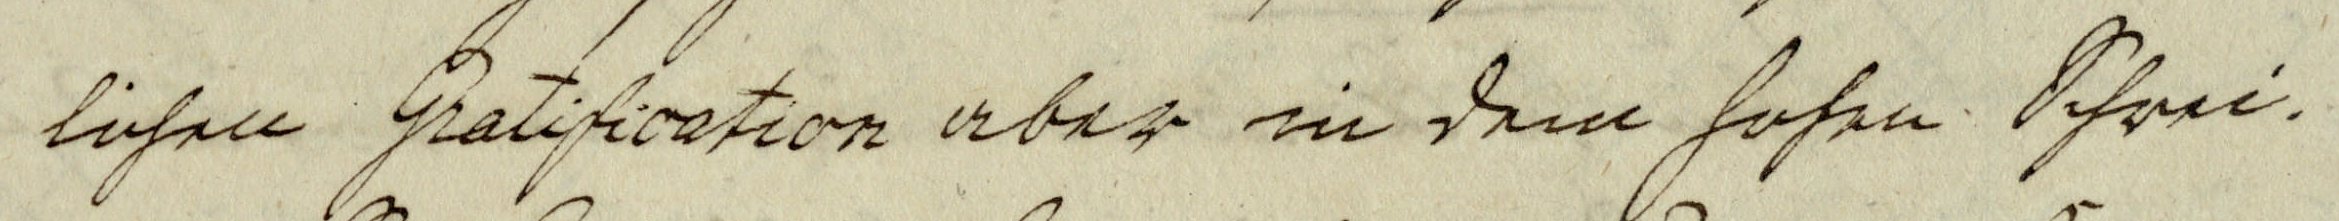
lichen Gratification aber in dem Hohen Schrei¬
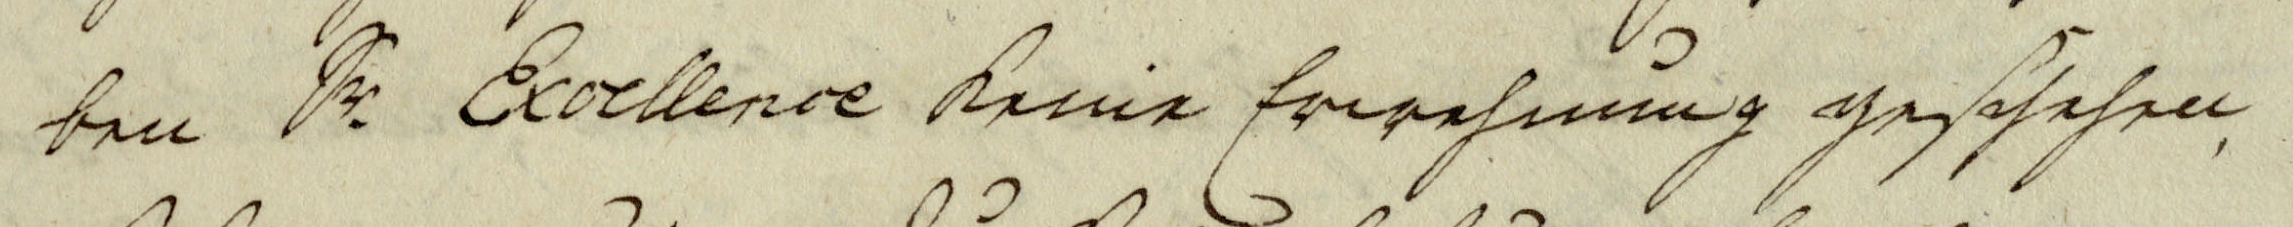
ben Sr. Excellence keine Erwehnung geschehen,
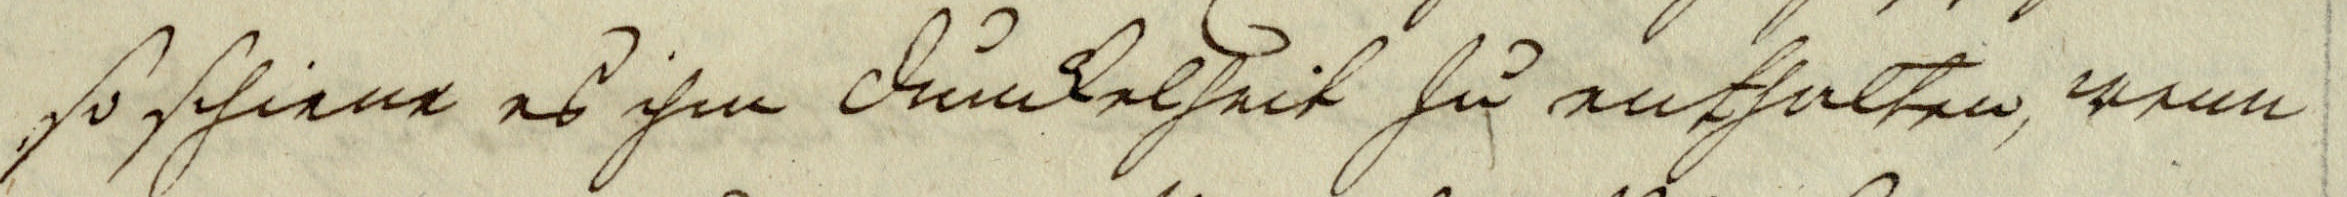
so schiene es ihm Dunkelheit zu enthalten, wenn
